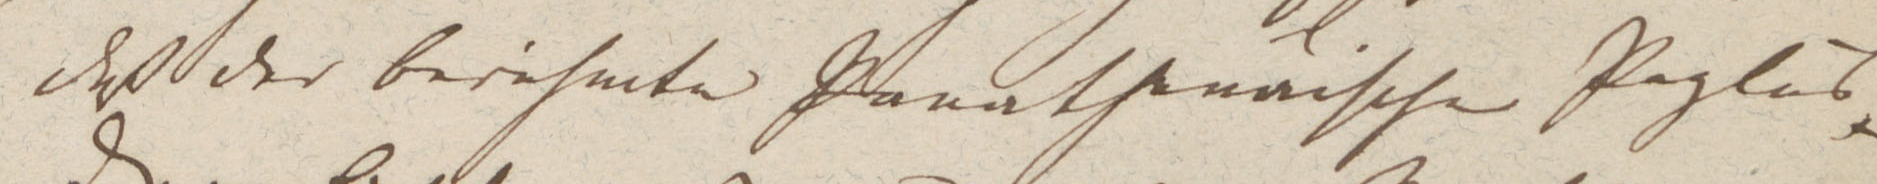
dass der berühmte Panathenäische Peplos
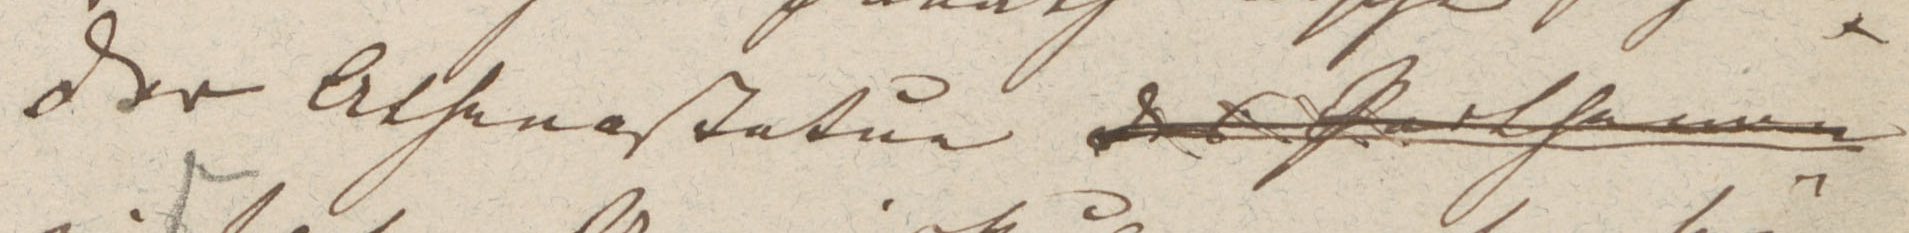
der Athenastatue des Parthamien
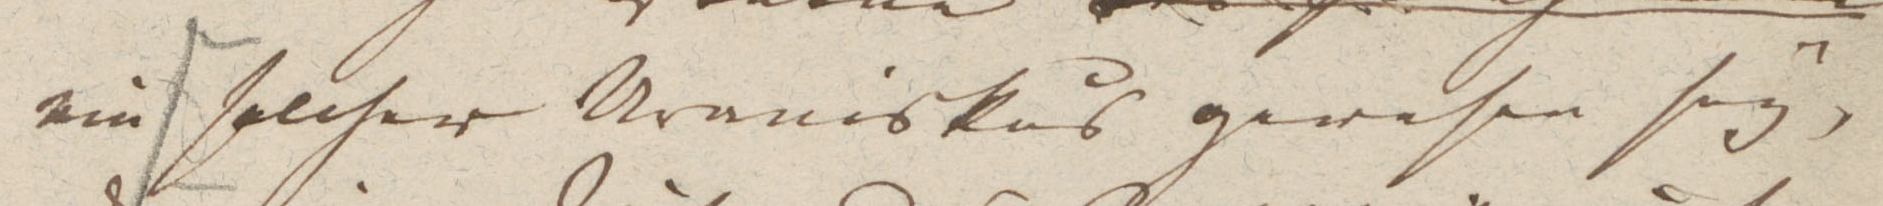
ein %solcher Uraniskus gewesen sey,
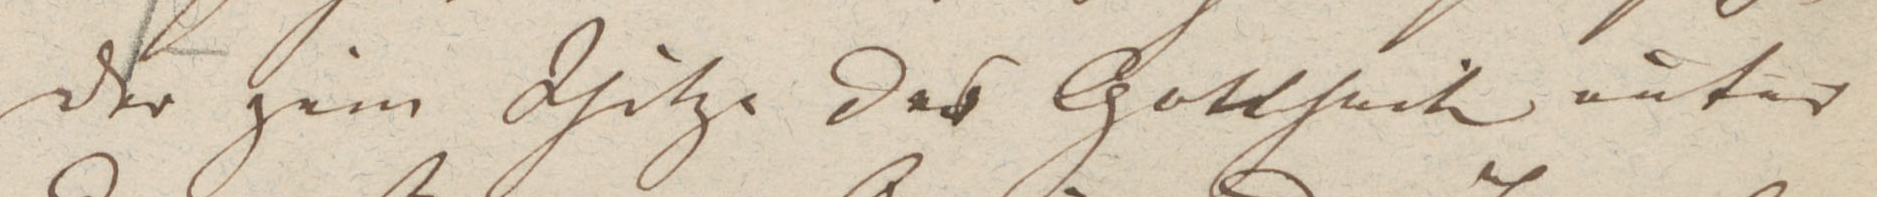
der zum Schutze desr Gottheit unter
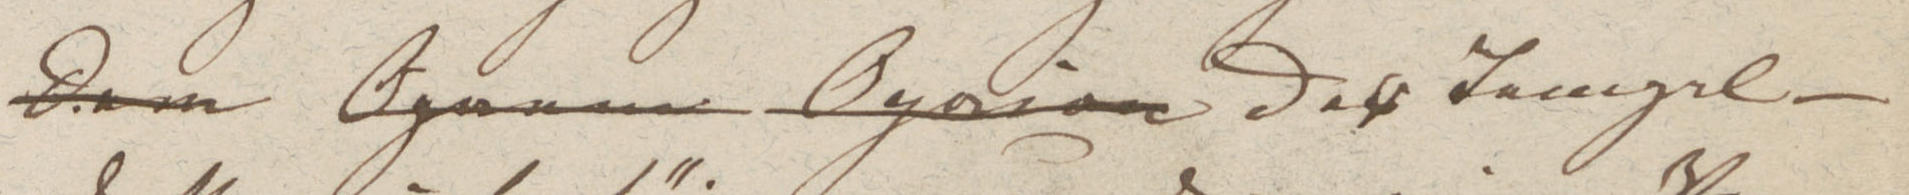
dem Opam Opaion desr Tempel-
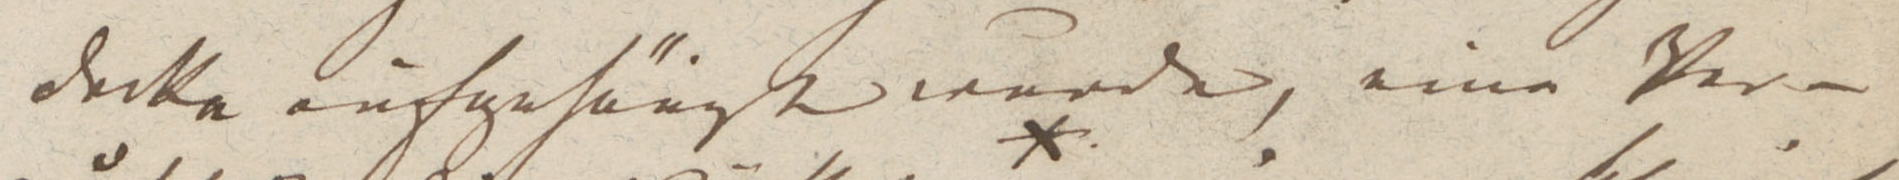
decke aufgehängt wurde, eine Ver-
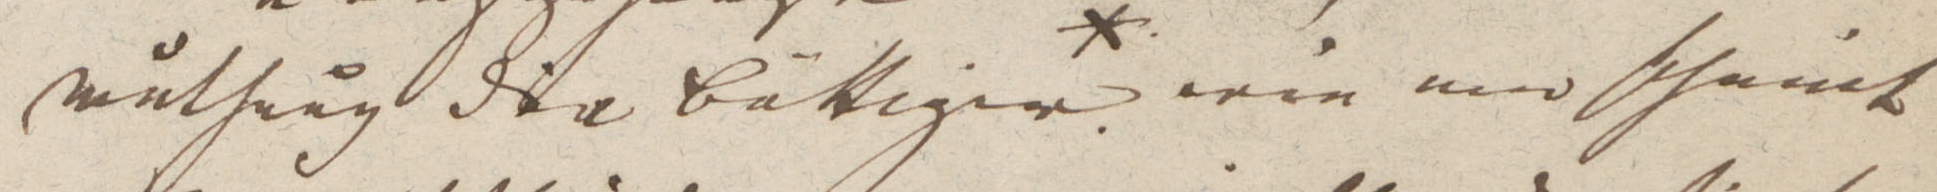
muthung derie Böttiger % wie mir scheint
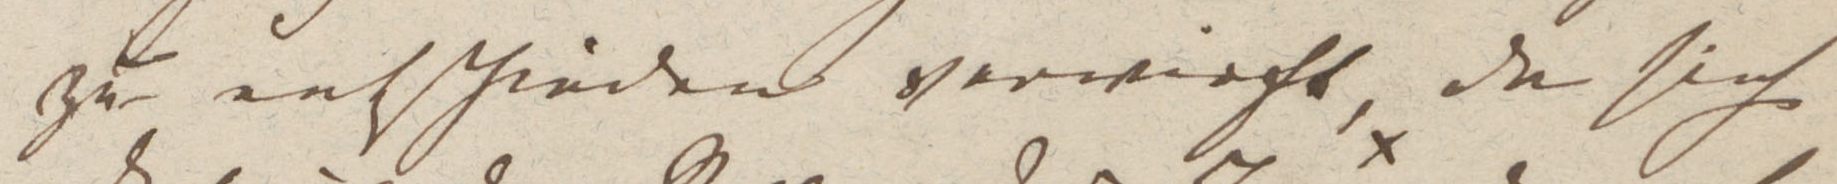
zu entschieden verwirft, da sich
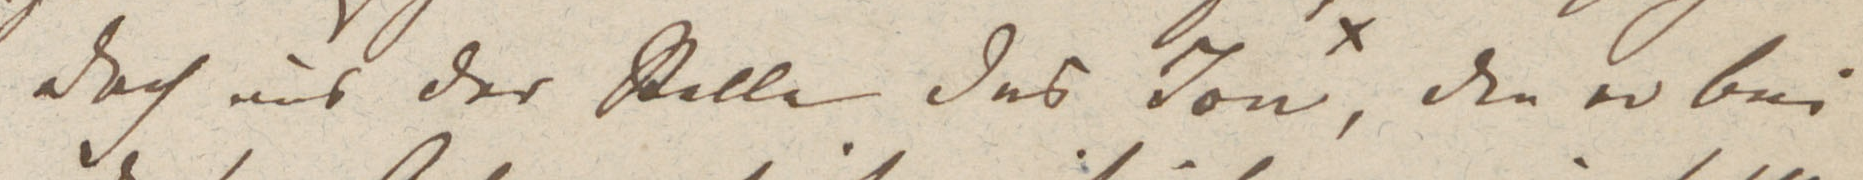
doch aus der Stelle des Jon%, die er bei
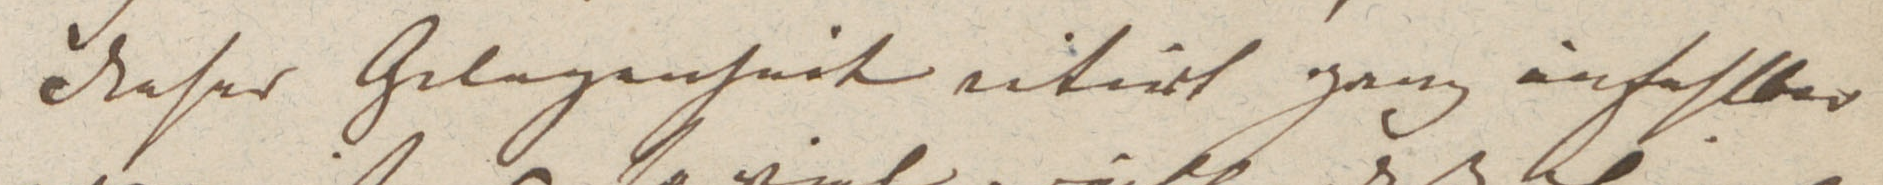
dieser Gelegenheit citirt ganz unfehlbar
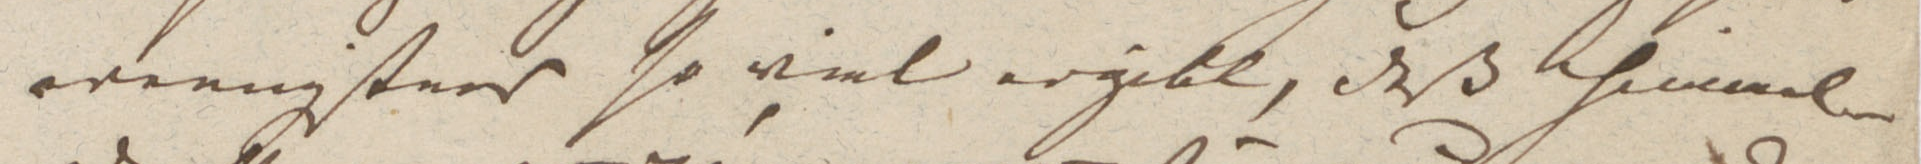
wenigstens so viel ergibt, dass Himmel-
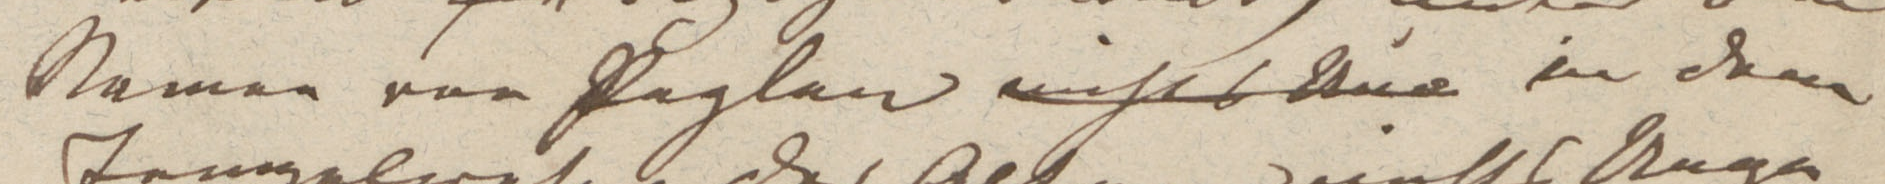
Namen von Peplen nichts Un in dem
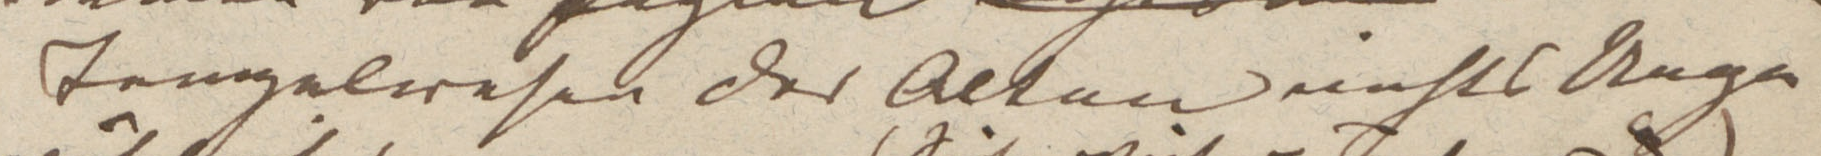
Tempelwesen der Alten nichts Unge
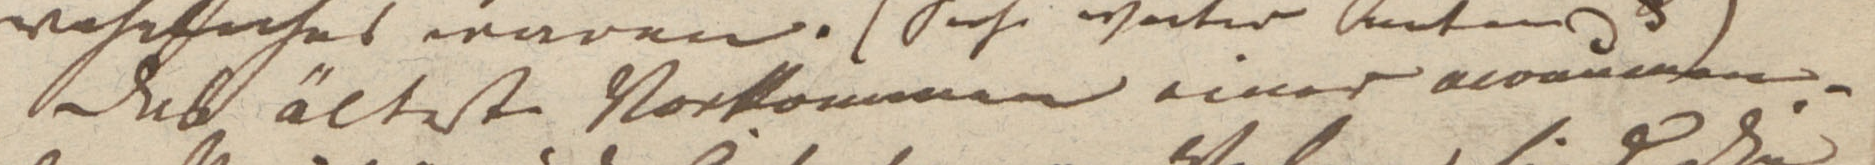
Das älteste Vorkommen einer monumen-
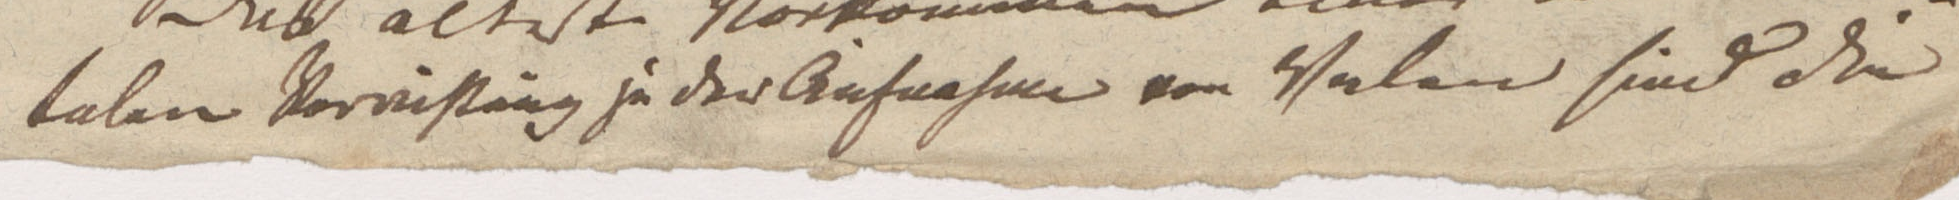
talen Vorrichtung zu der Aufnahme von Velen sind die
